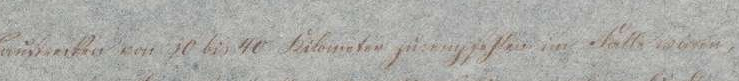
Baustrecken von 30 bis 40 Kilometer zu empfehlen im Falle wären,
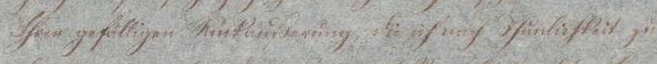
Ihrer gefälligen Rückäußerung, die ich nach Thunlichkeit zu
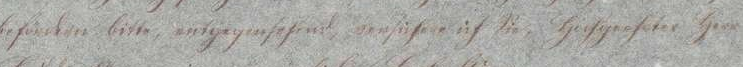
befördern bitte, entgegensehend, versichere ich Sie, Hochgeehrter Herr
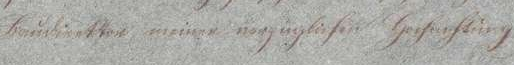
Baudirektor, meiner vorzüglichen Hochachtung.
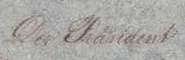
Der Präsident
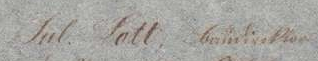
Jul. Lott, Baudirektor
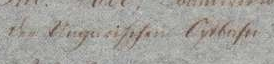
der Ungarischen Ostbahn
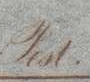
Pest.
